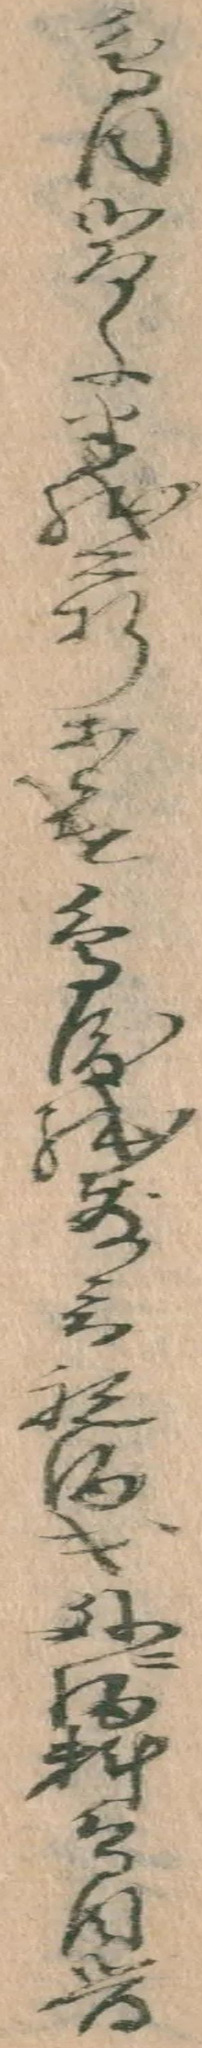鳥目弐百文半紙二折等被遣鳥渡紙敷ニ而祝酒出外ニ酒料鳥目弐百
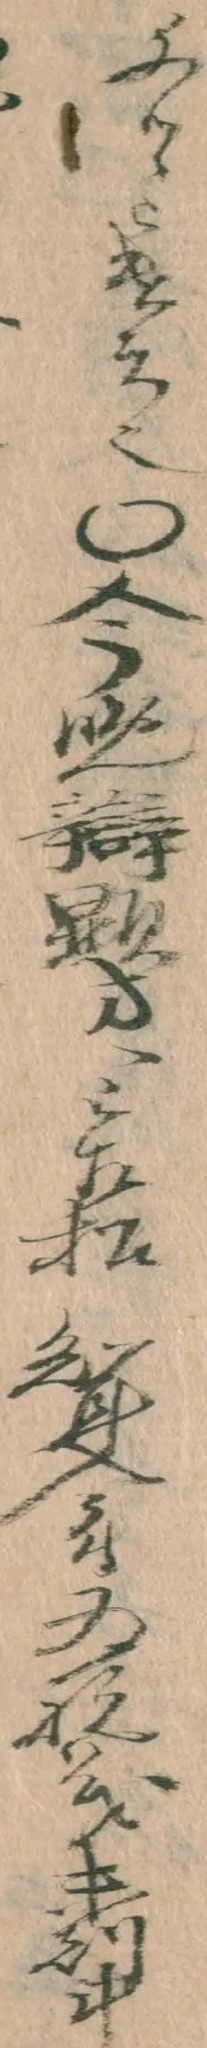文ツヽ被遣云也○今晩辨顕方へ被相招聟入ニ付為祝義未刻斗
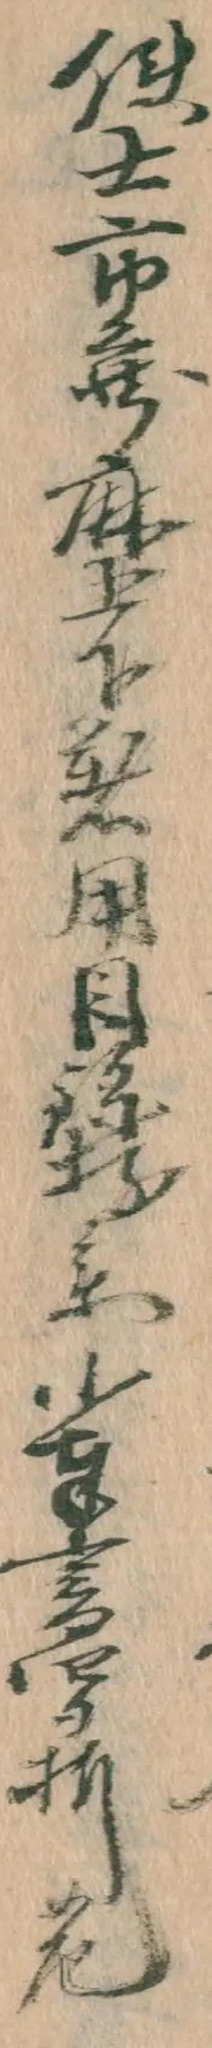使士市蔵麻上下着用目録持参小奉書四ツ折如左
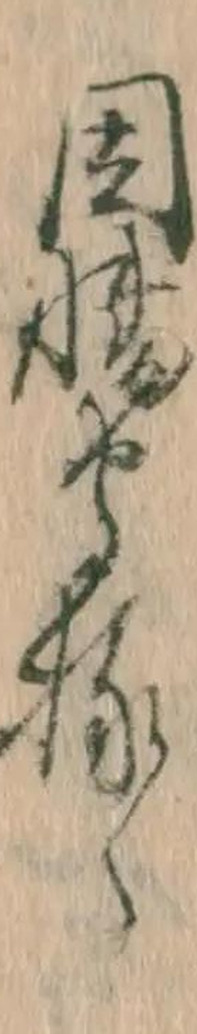因幡守様ゟ
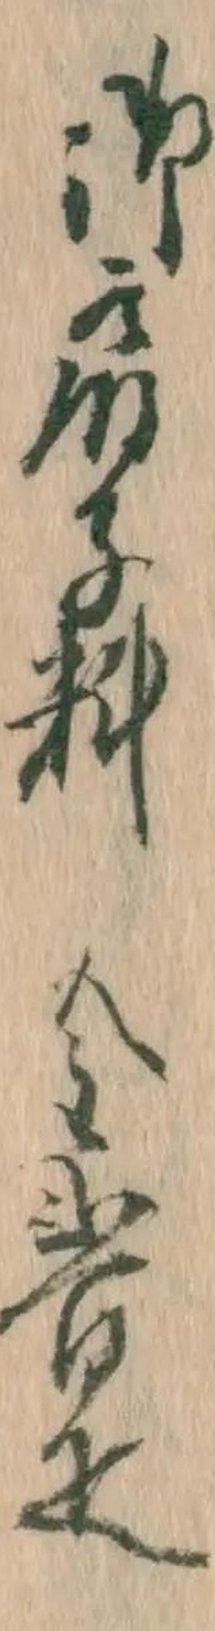御扇子料金弐百疋
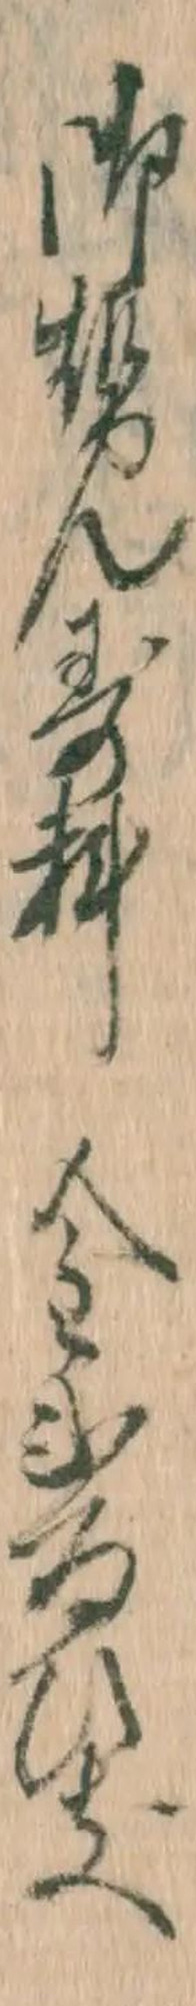御せんす料金弐百ひき
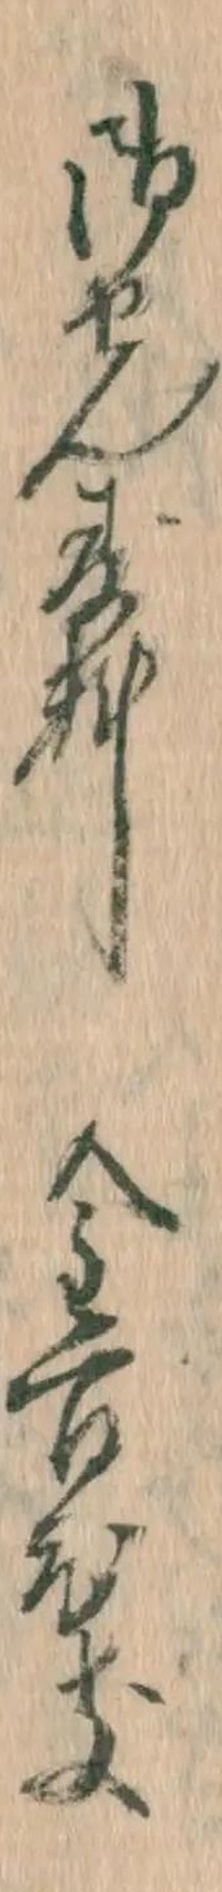御せんす料金百ひき
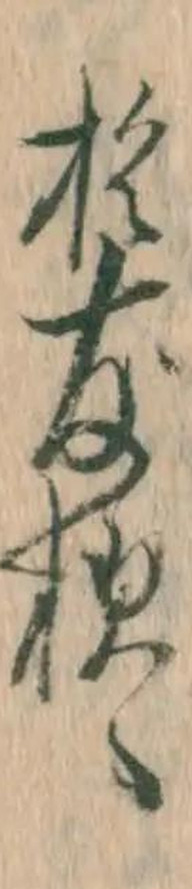お友様へ
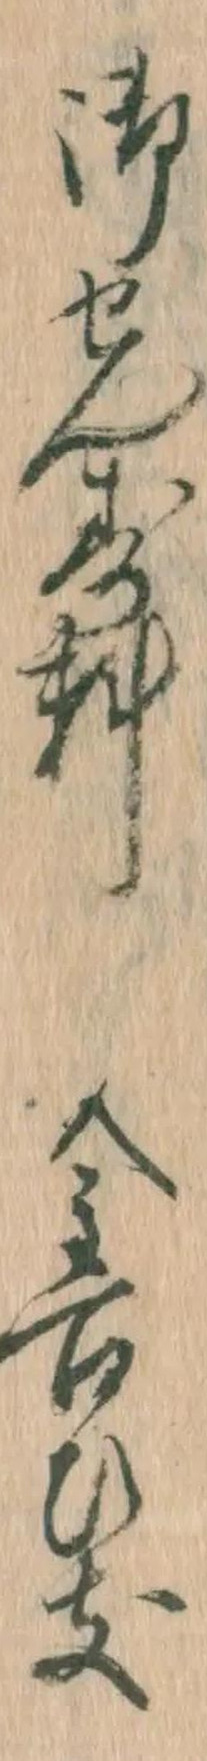御せんす料金百ひき
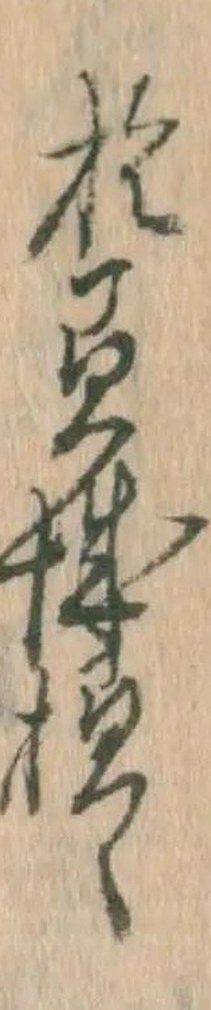於かね様へ
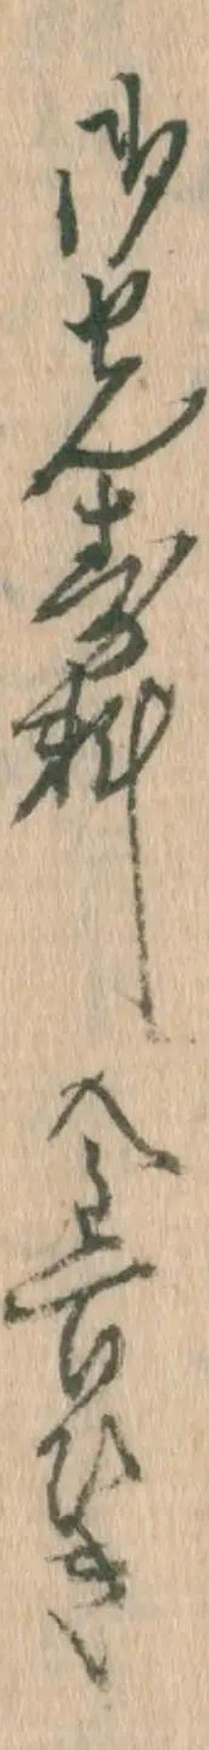御せんす料金百ひき
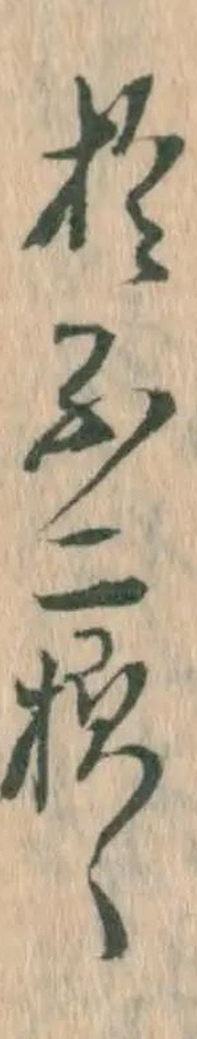於かね様へ
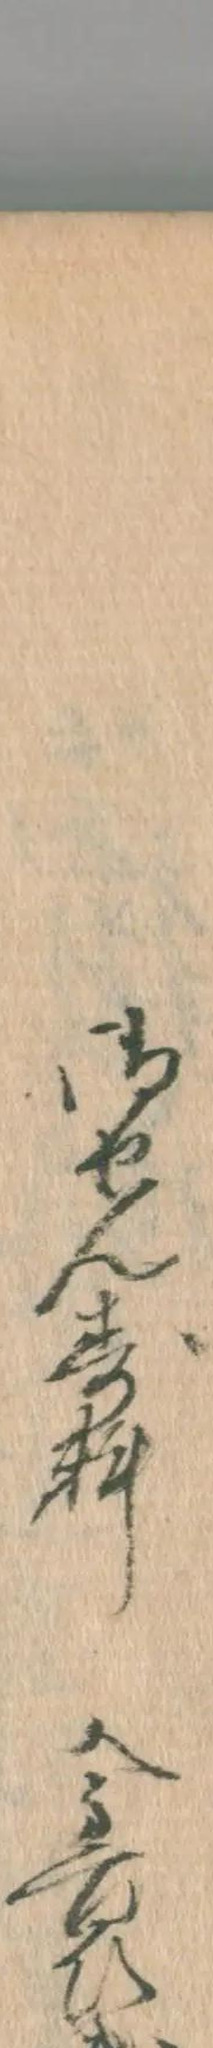御せんす料金百ひき
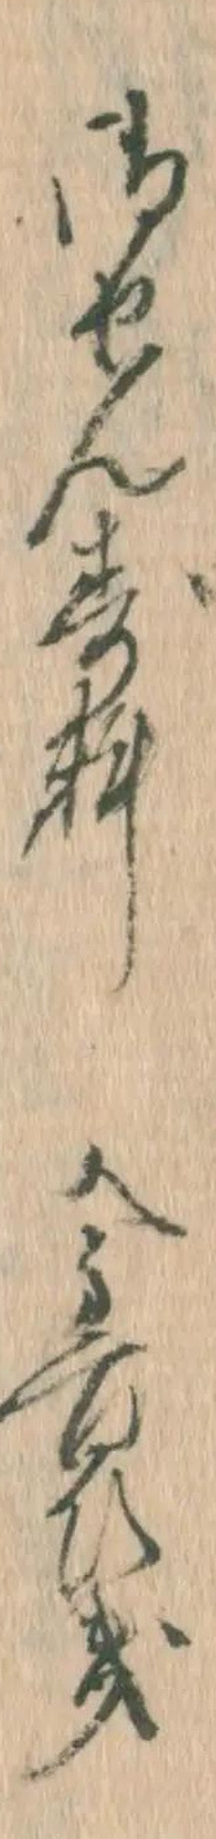御せんす料金百ひき
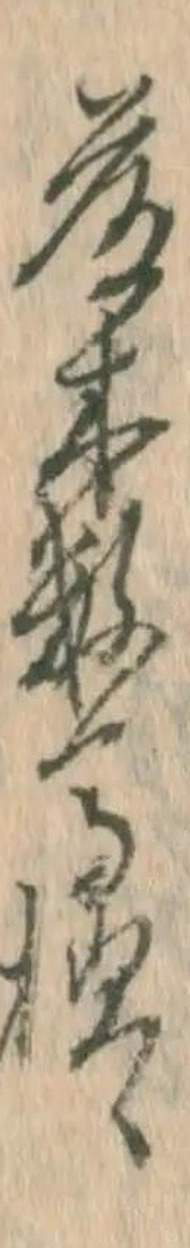藤木数馬様へ
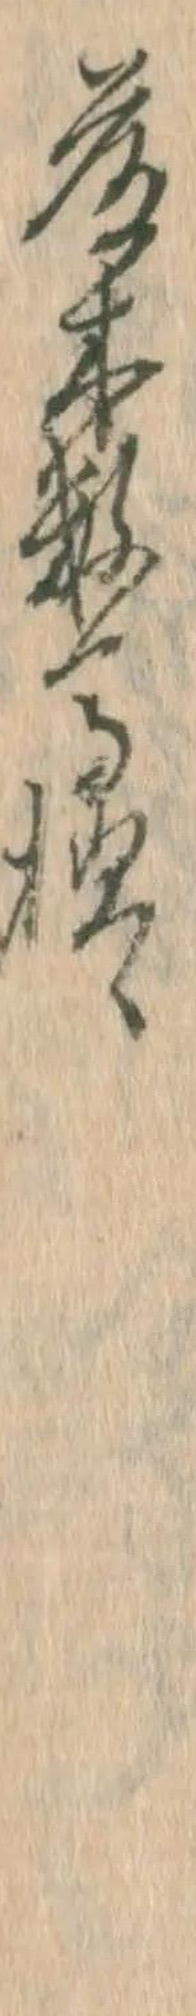藤木数馬様へ
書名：賀茂社記録. 第69冊
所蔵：国立国会図書館 National Diet Library, JAPAN
